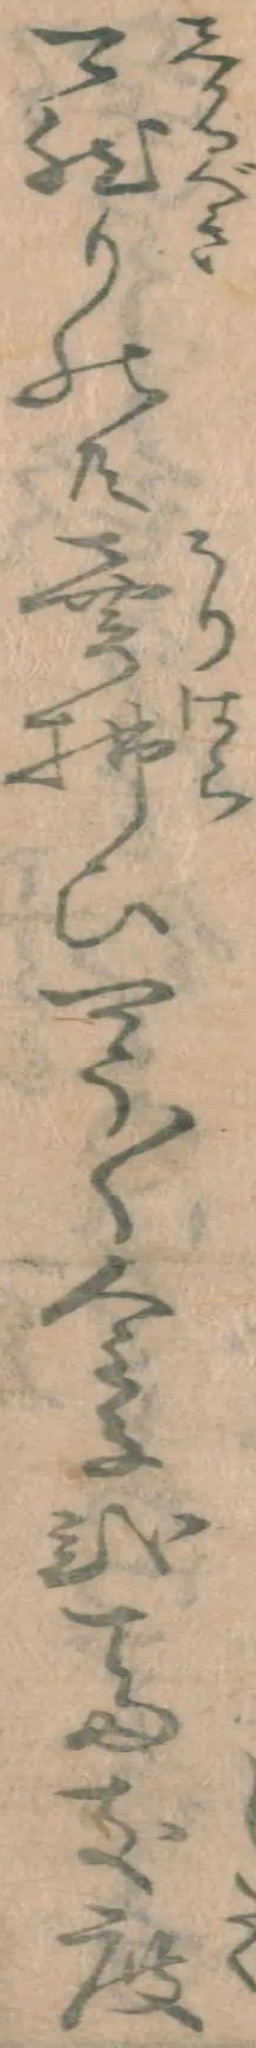可然もの共売払ひやう〳〵金子弐十両支度
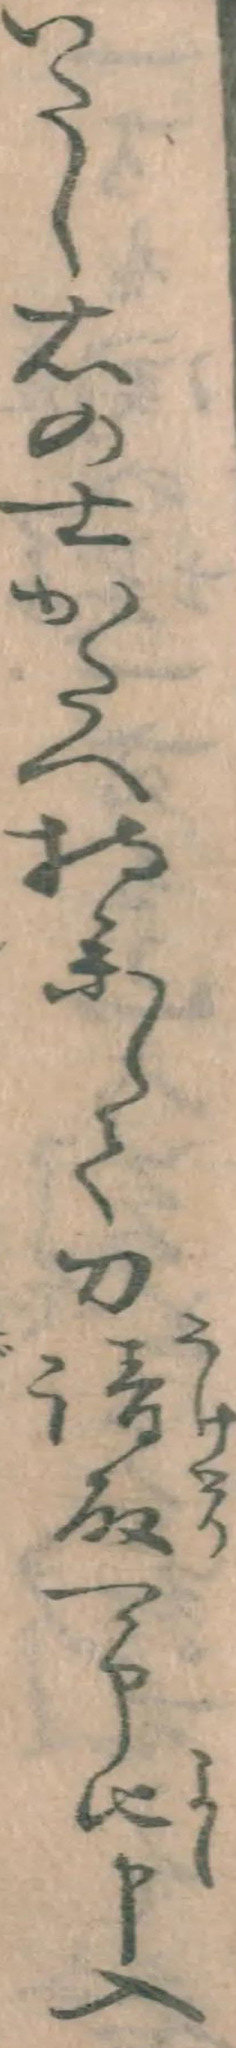いたし右の士かたへ持参して刀請取可申由申入
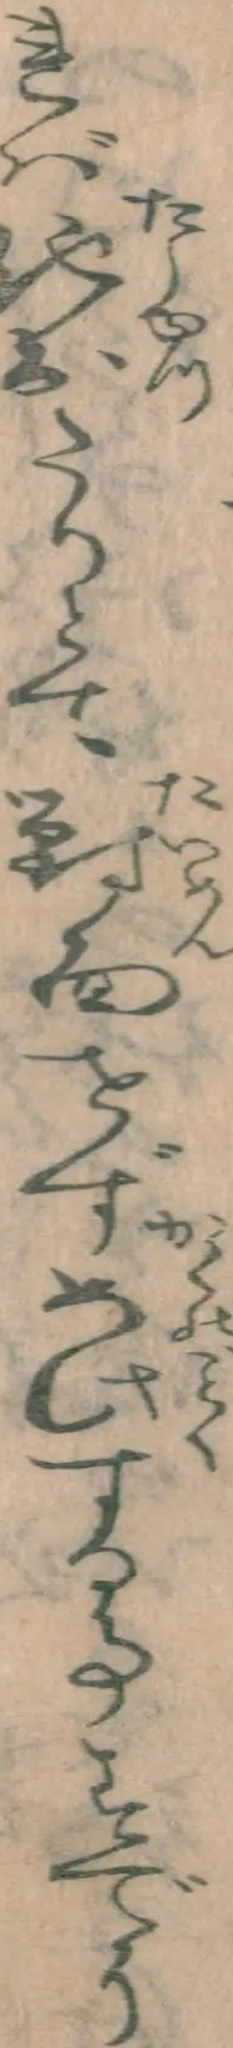れば他出たりとて対面せず如此する事すでに
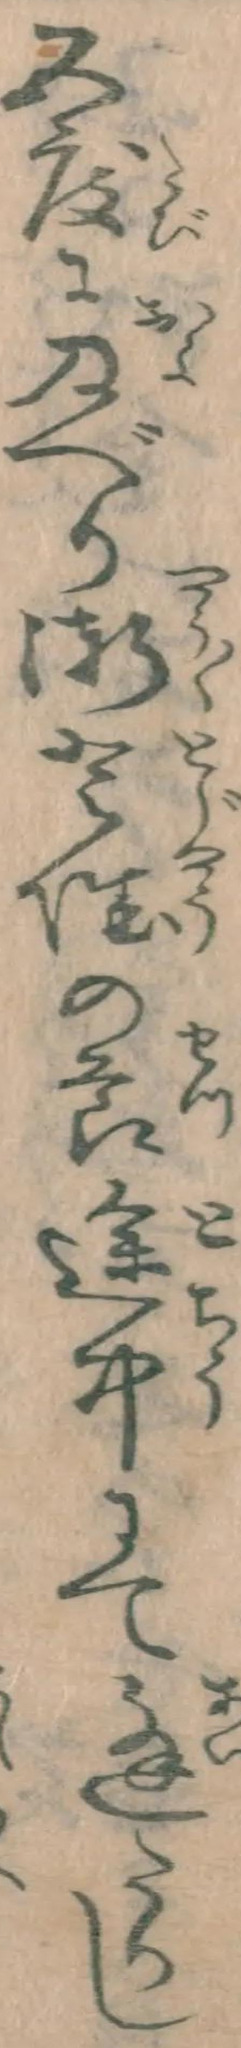五度に及べり漸登城の節途中にて逢たりし
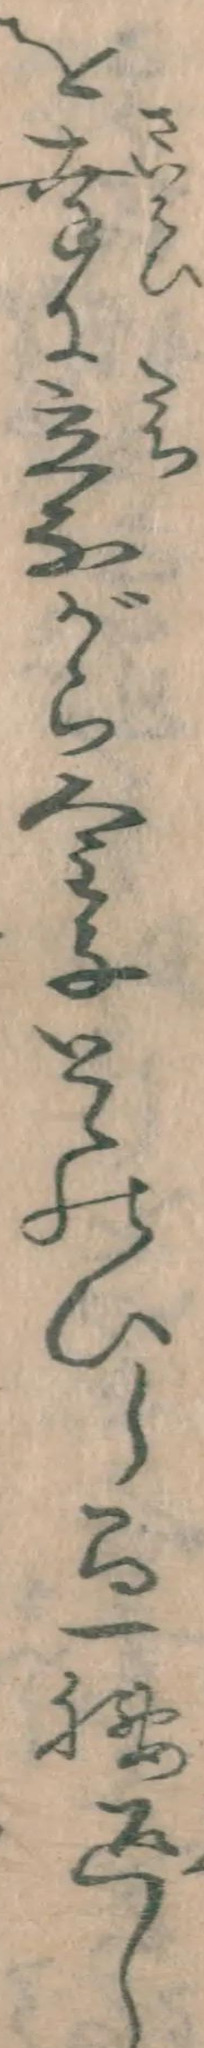を幸に立ながら金子とゝのひし間一腰返し
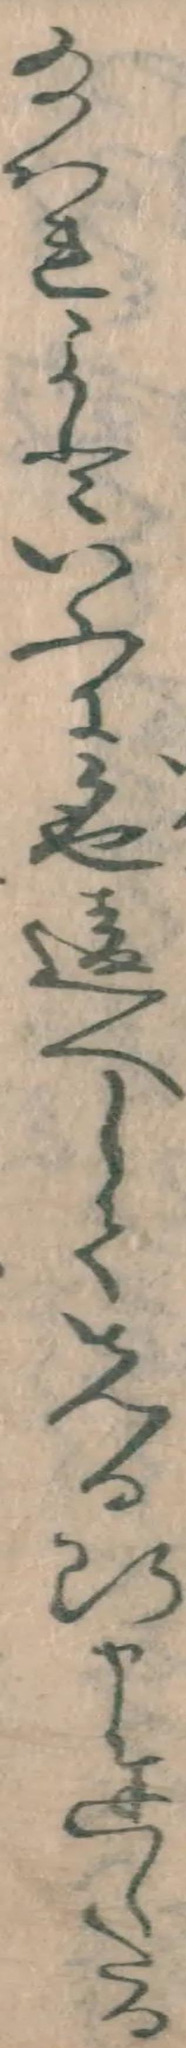給はれよといふに色違へして先日断申達したる
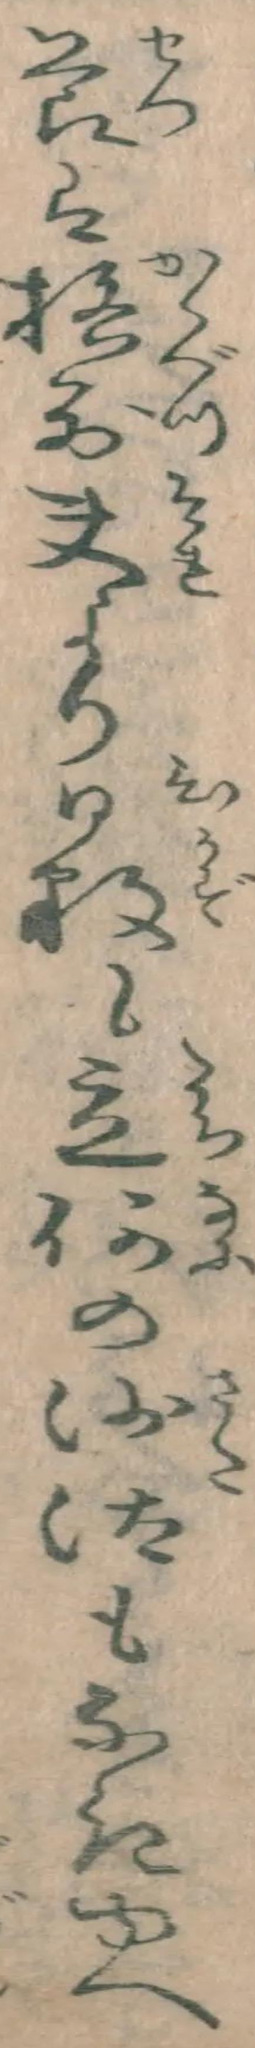節は格別夫より日数も立何の沙汰もなきゆへ
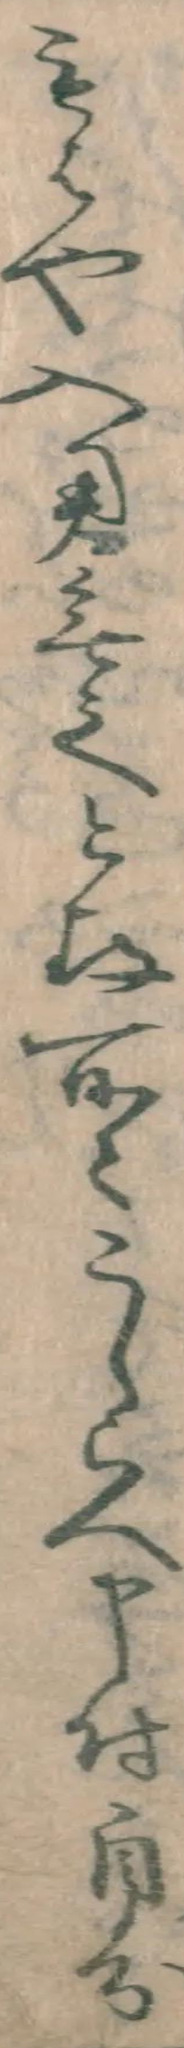もはや入用無之と存所々こしらへ申付自分
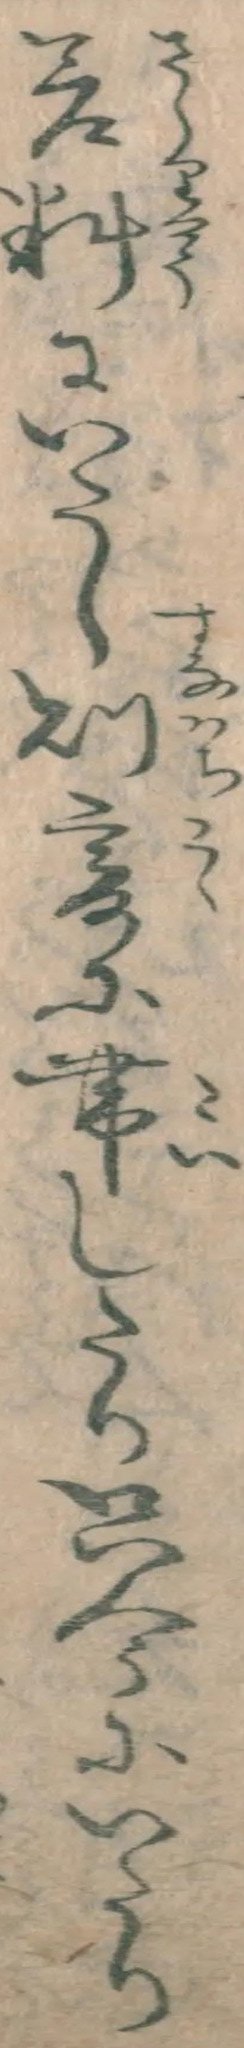差料にいたし則爰に帯したり只今にいたり
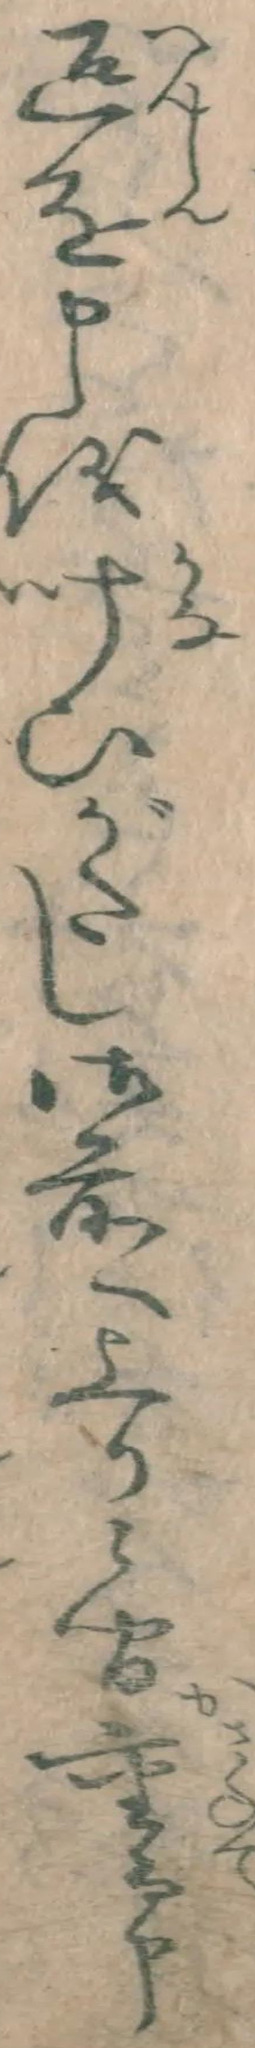返進申儀叶ひがたし御前へ上り候間重而申
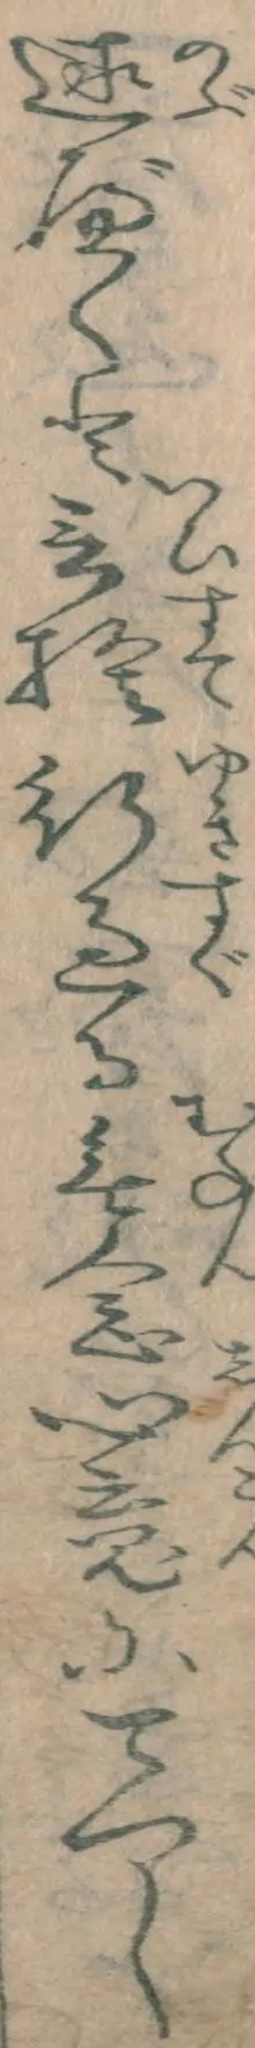述べくと言捨行過る無念心魂にてつし

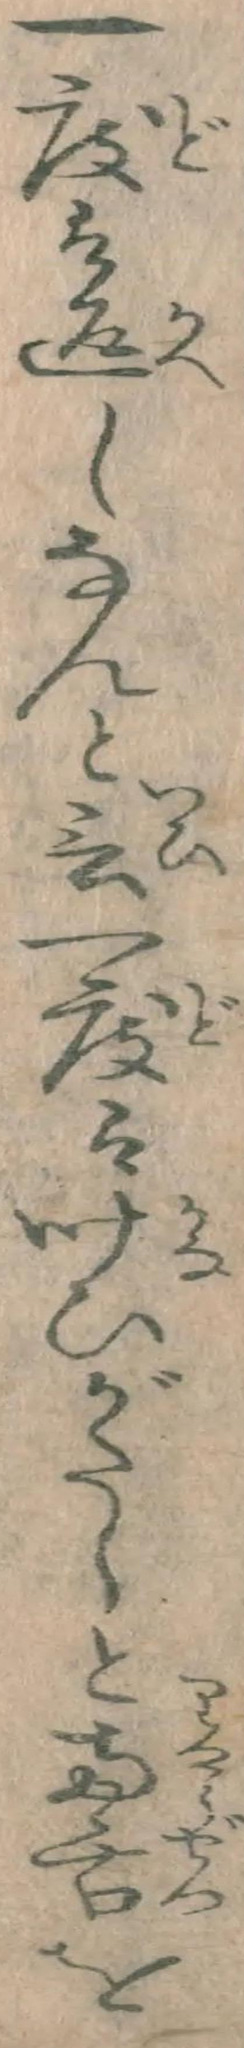一度立返しなんと言一度は叶ひがたしと両舌を
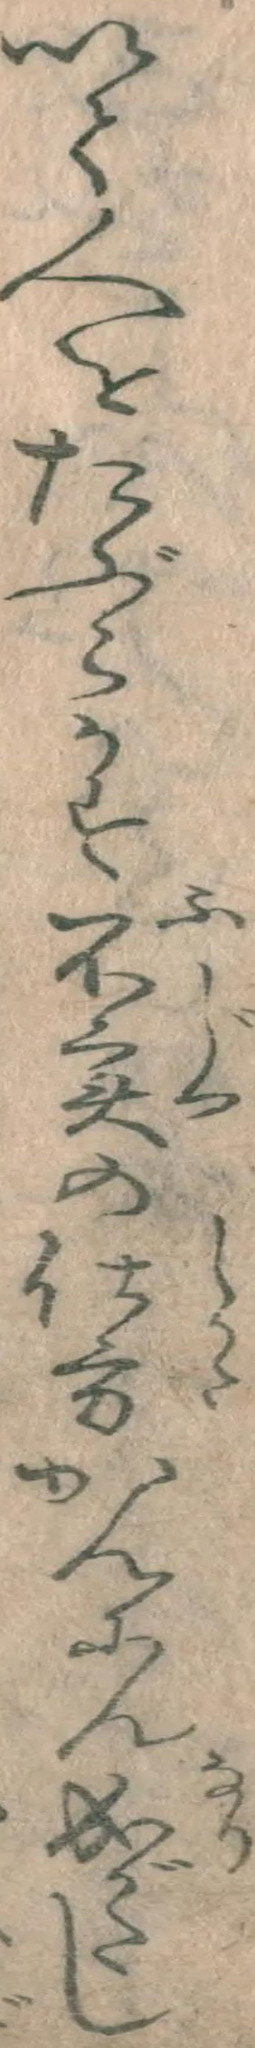以て人をたぶらかす不実の仕方かんにん成がたし
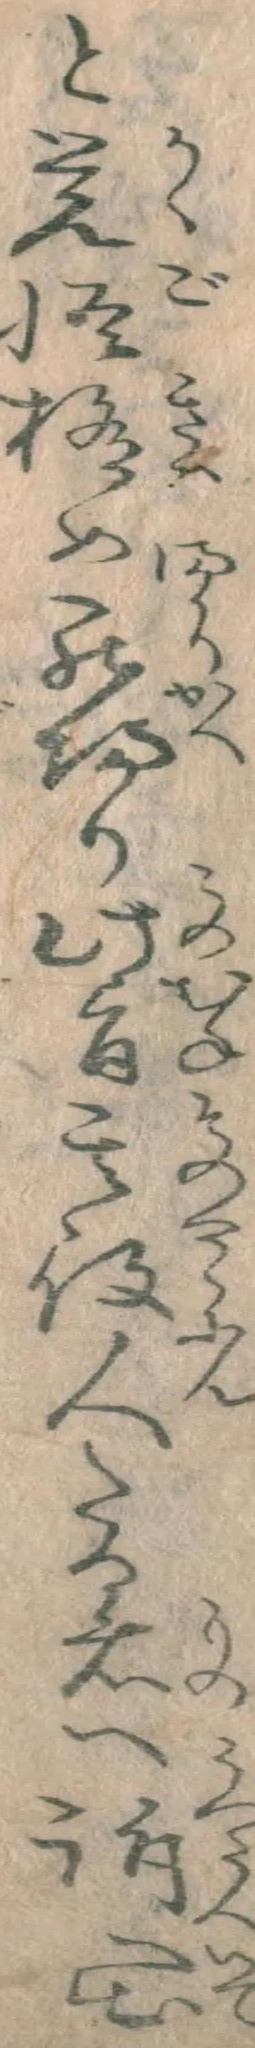と覚悟極め罷帰り此旨其役人たる者へ訴へ出
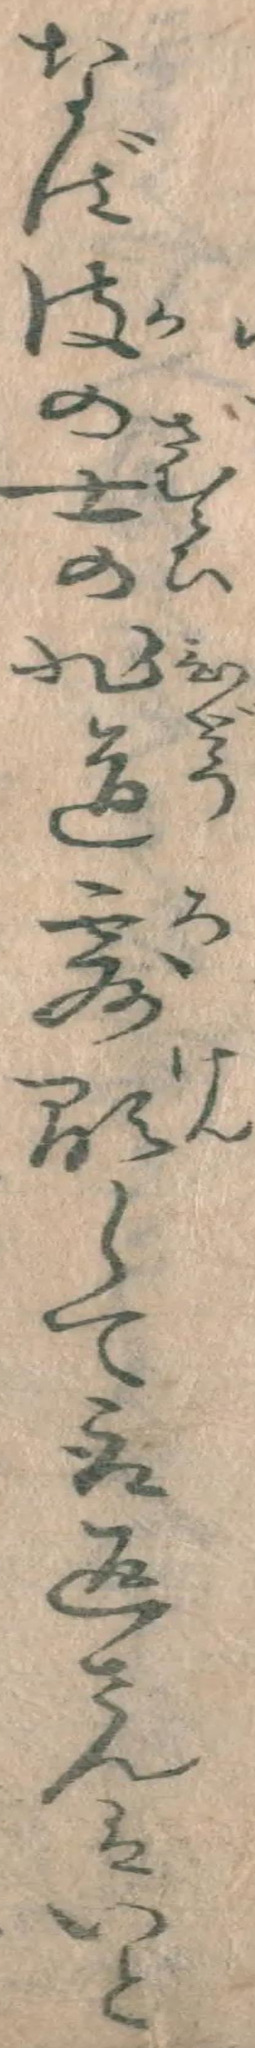なば彼の士の非道露顕して取返さんはいと
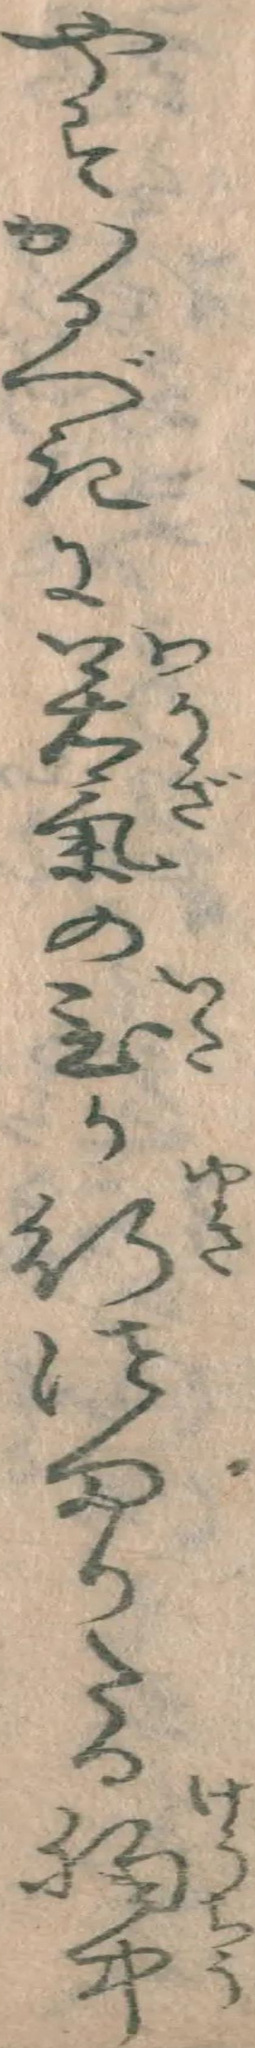やすかるべきに若気の至り行つまりたる胸中
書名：怪談御伽童 5巻. [2]
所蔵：国立国会図書館 National Diet Library, JAPAN
